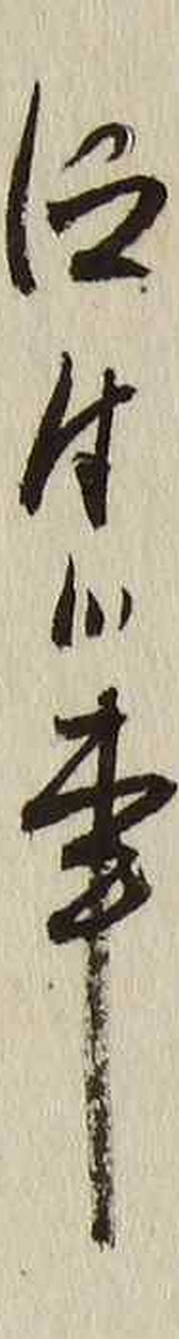仰付候事
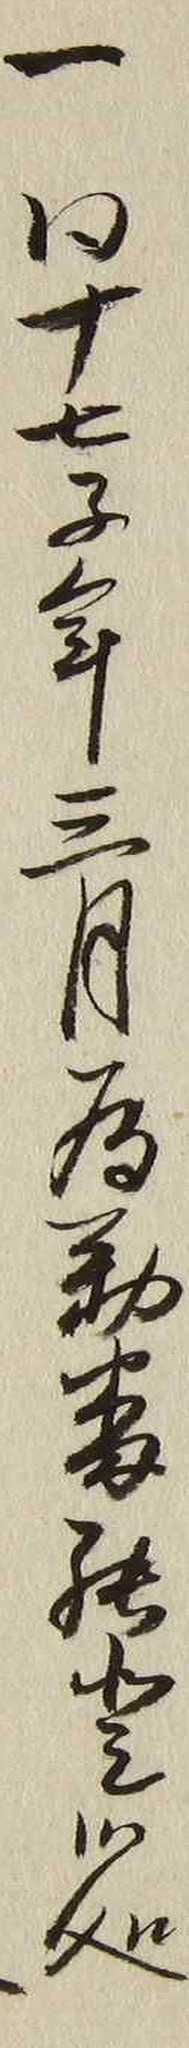一同十七子年三月為勤番罷登候処
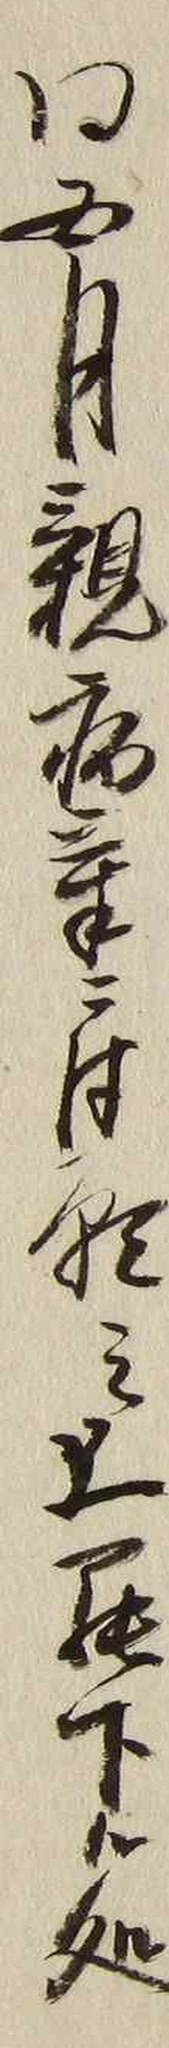同五月親病気ニ付願之上罷下候処
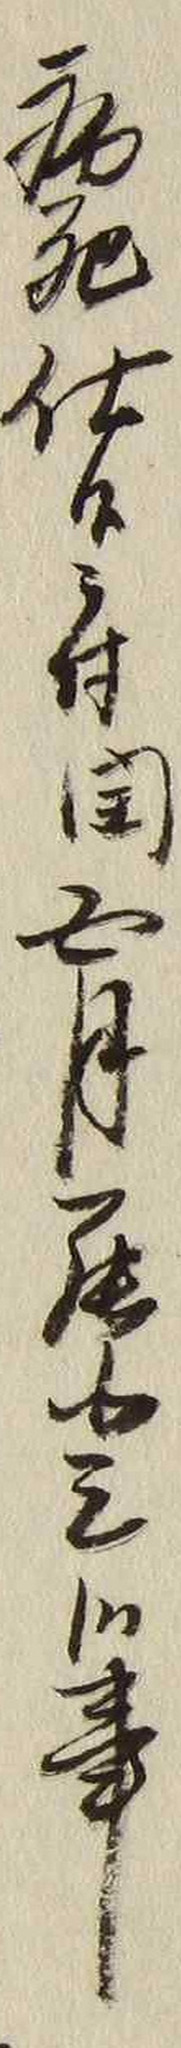病死仕候ニ付閏五月罷登候事
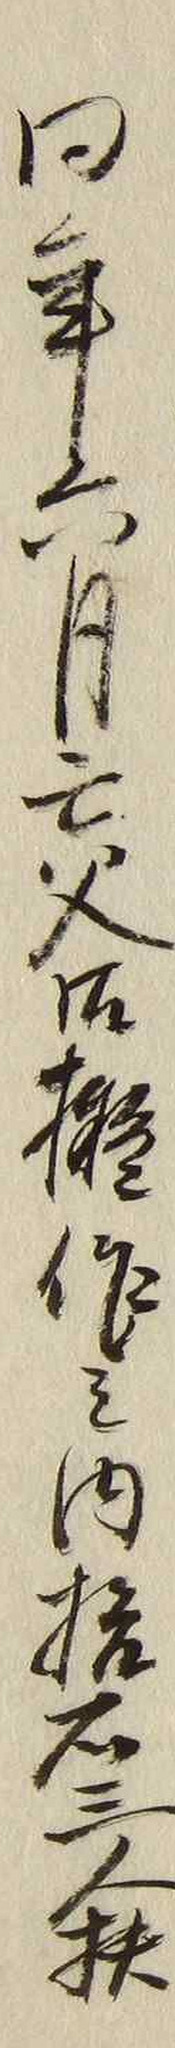一同年六月亡父御擬作之内拾石三人扶

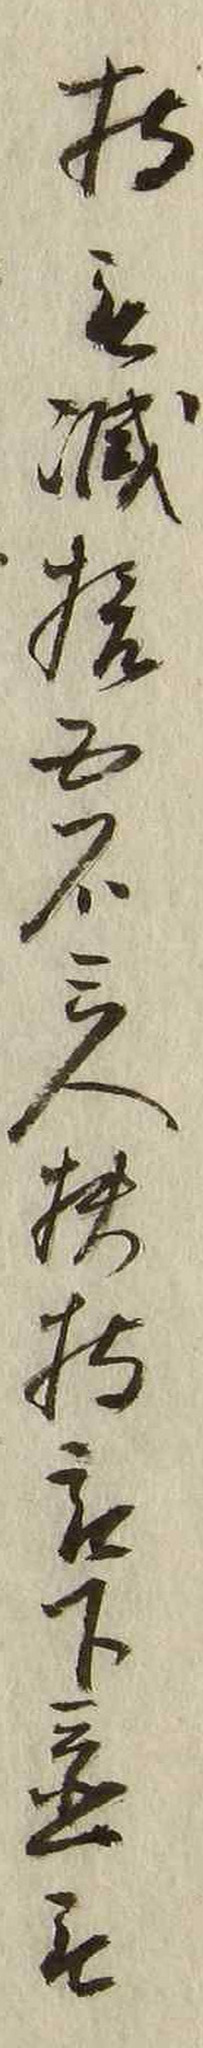持被減拾五石三人扶持被下置被
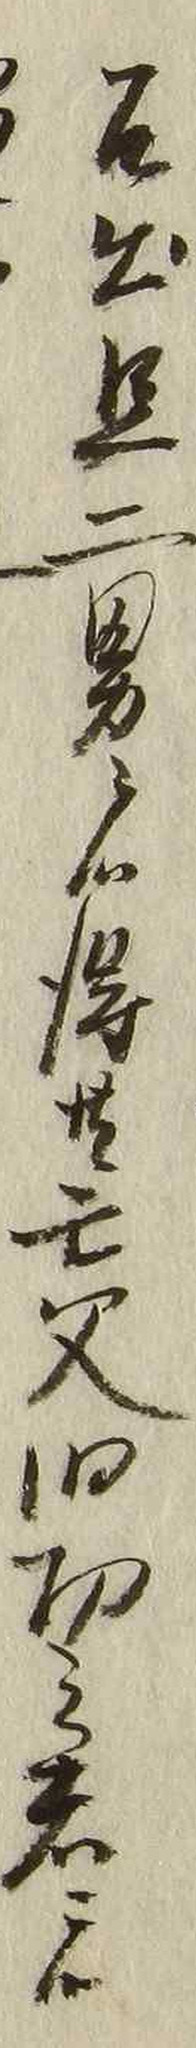召出且二男ニ候得共亡父旧功之者ニ候
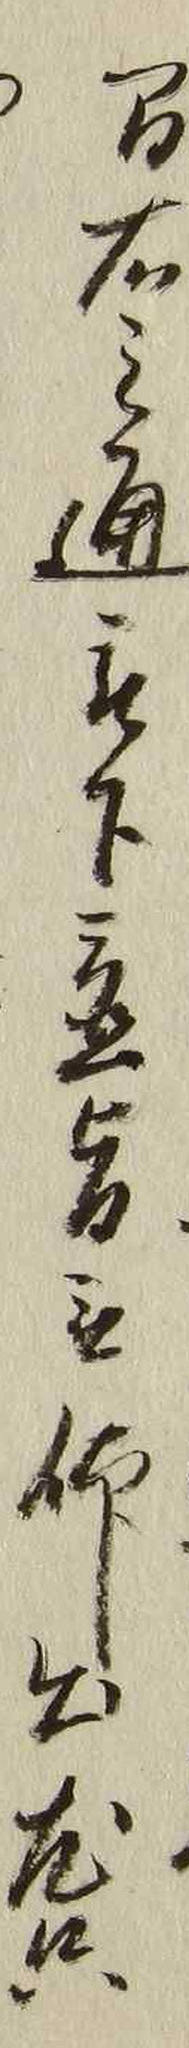間右之通被下置旨被仰出尤只
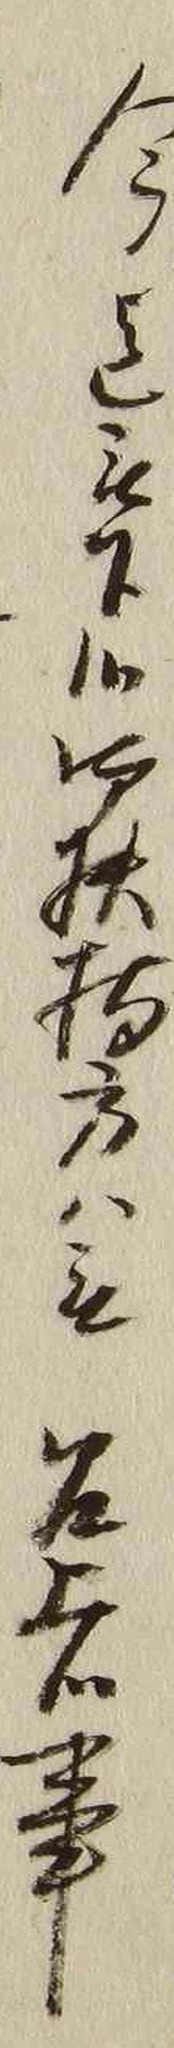今迄被下候御扶持方ハ被召上候事
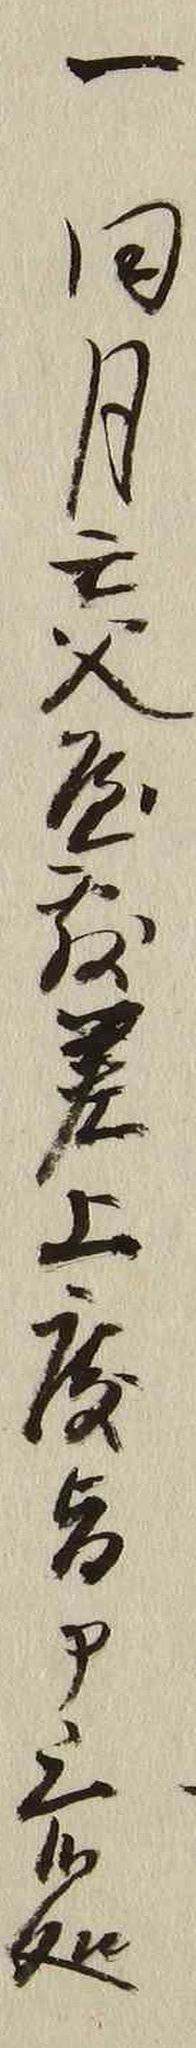一同月亡父屋敷差上度旨申上候処
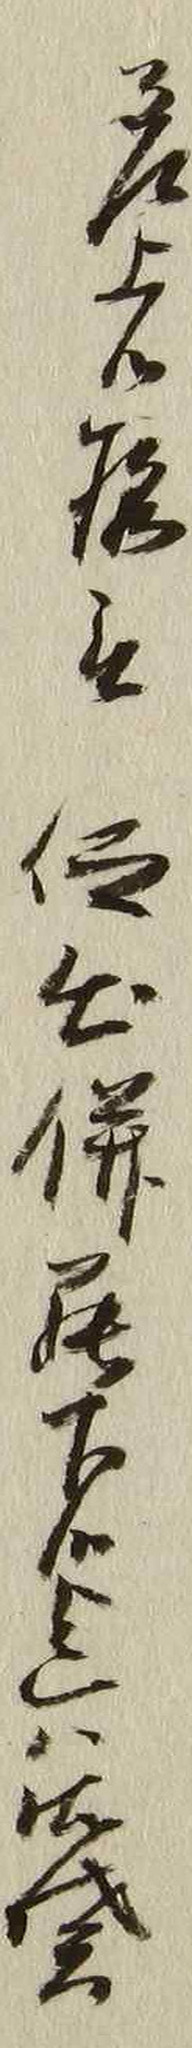差上候様被仰出併罷下候迄ハ御貸
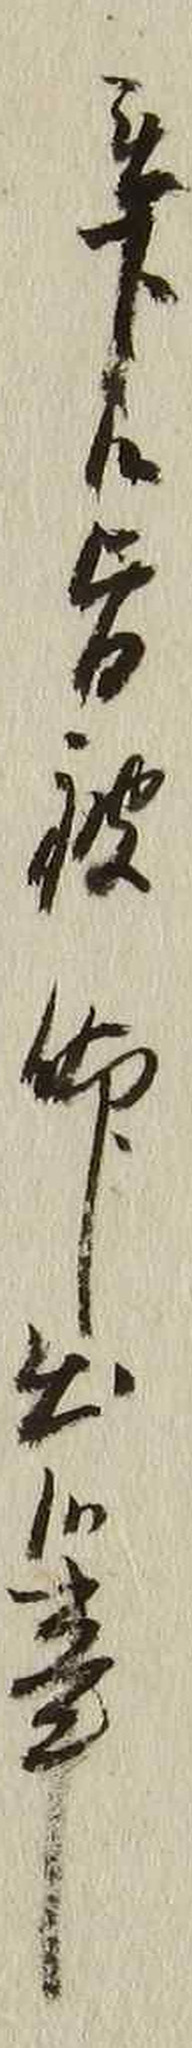被下候旨被仰出候事
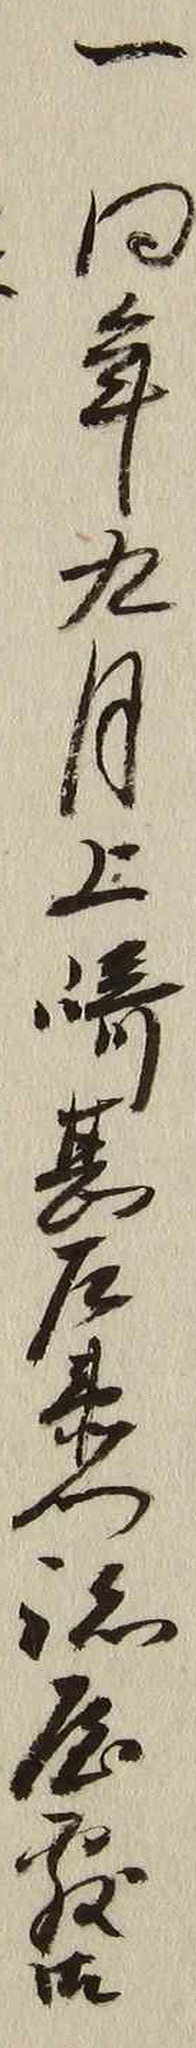一同年九月上崎甚左衛門跡屋敷御
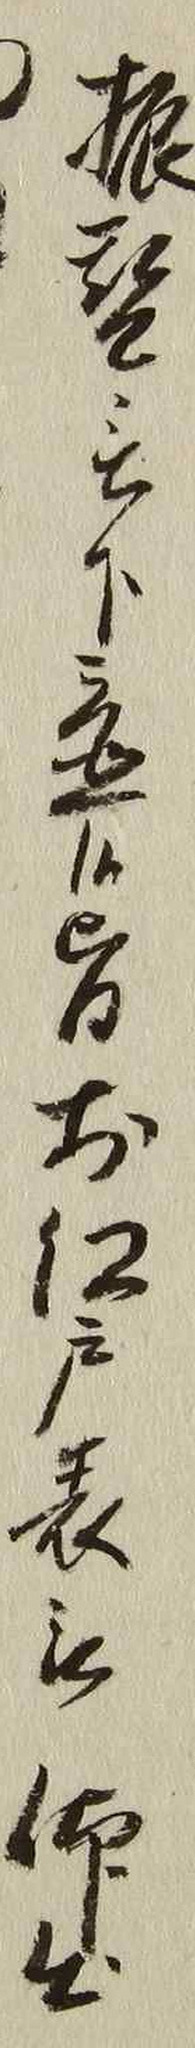振替被下置候旨於江戸表被仰出
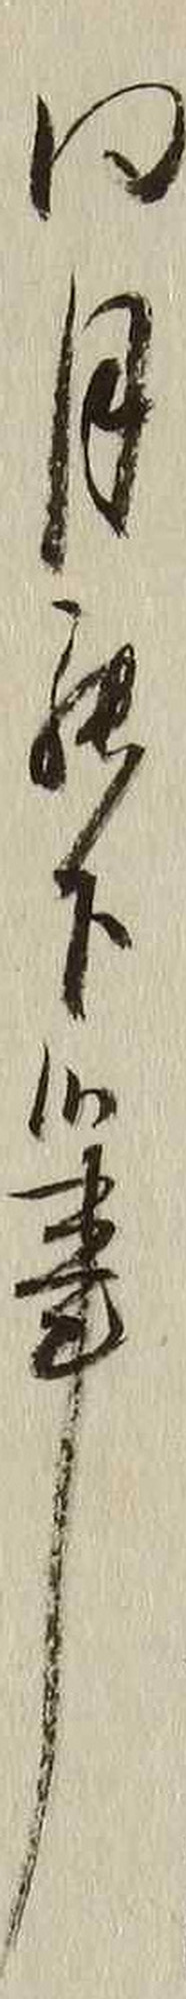同月罷下候事
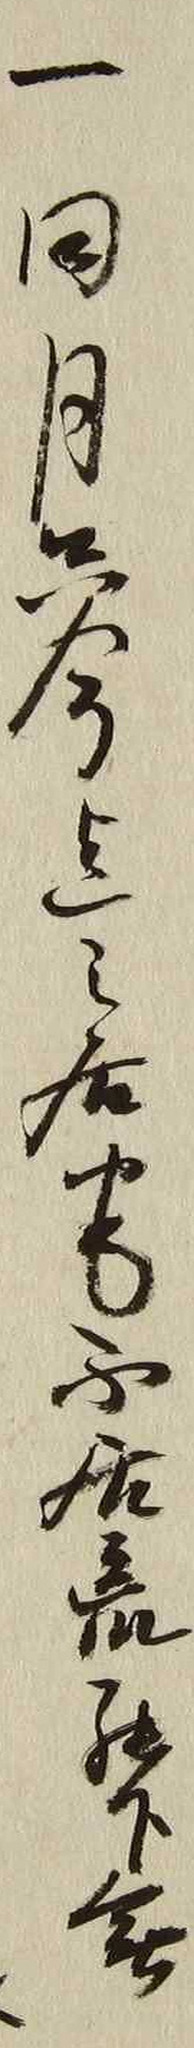一同月只今迄之居宅不居之故罷下無
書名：諸士系譜　巻之349　も之部5
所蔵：会津若松市立会津図書館
